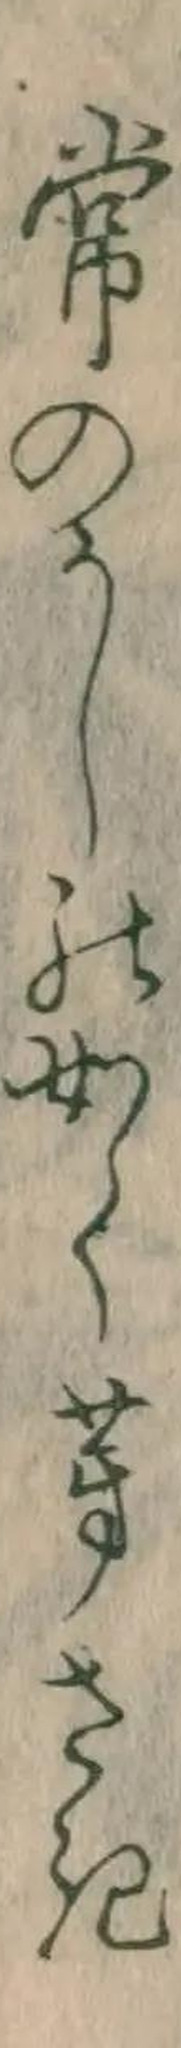常のかしの如く芽さき
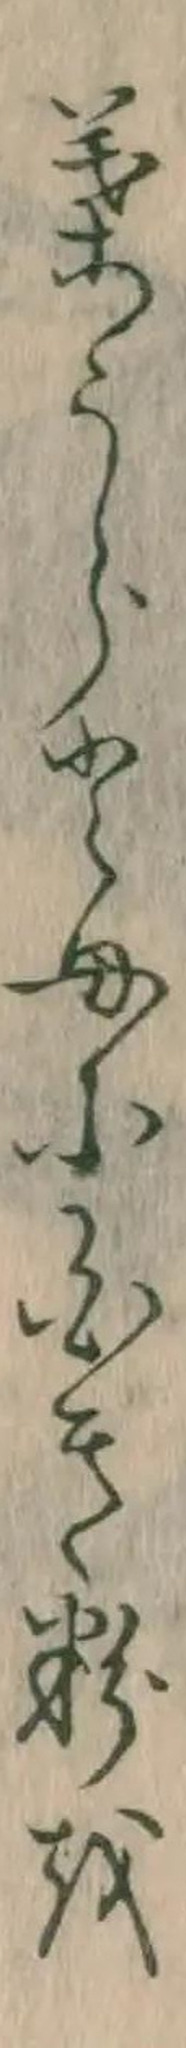葉うらともに白き粉を
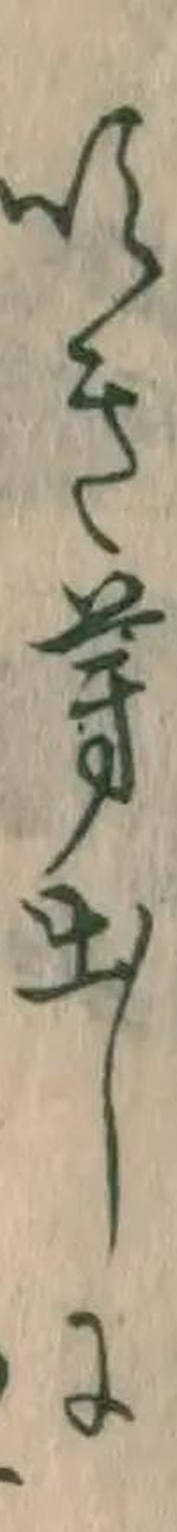吹き芽だしに
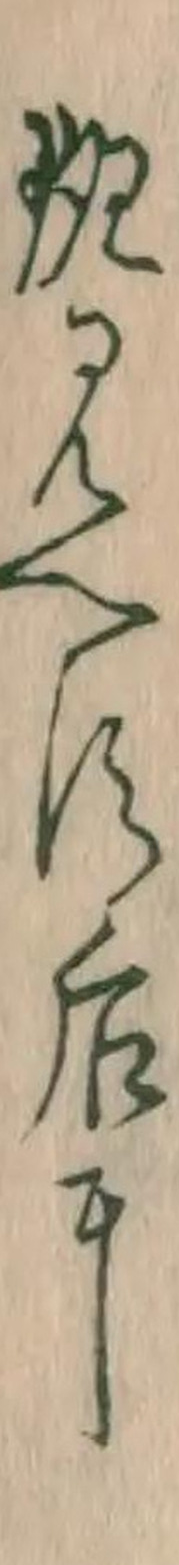斑見へす后に
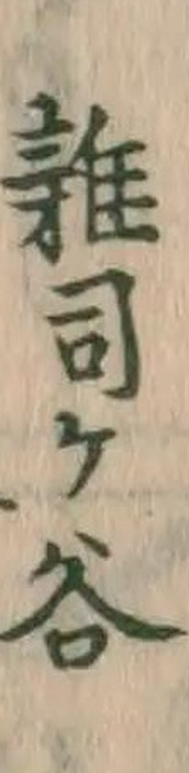雑司ヶ谷
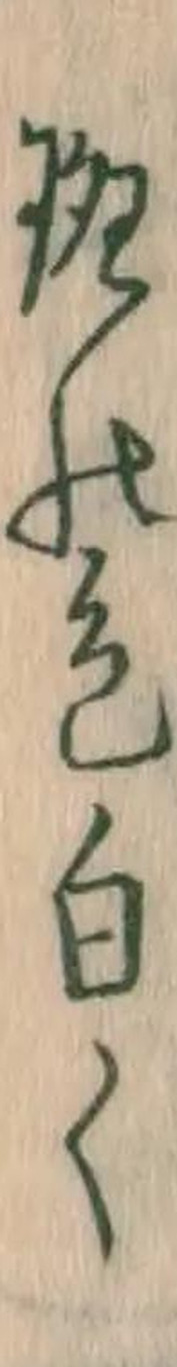斑の色白く
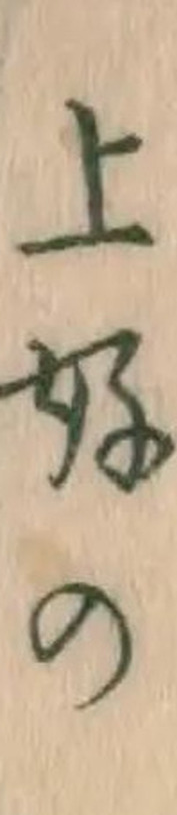上好の
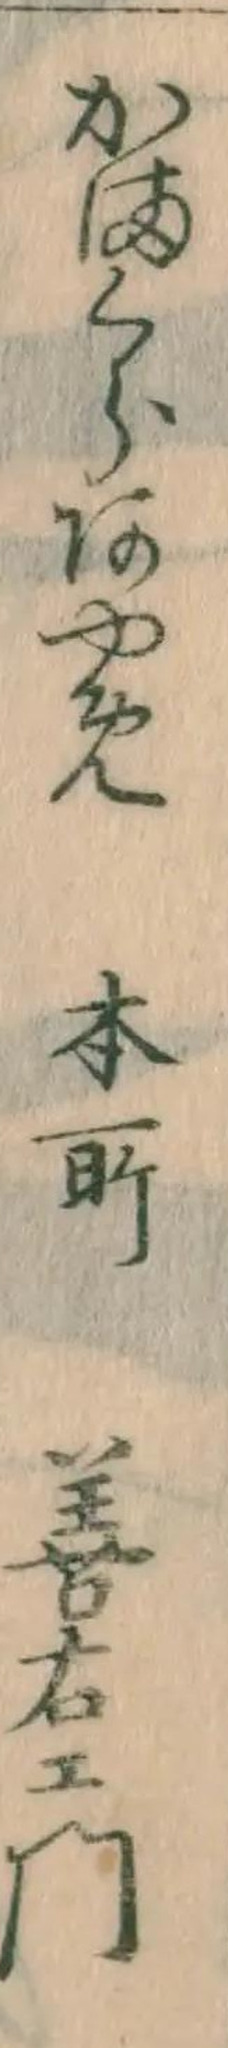かまくらあやめ本所善右エ門
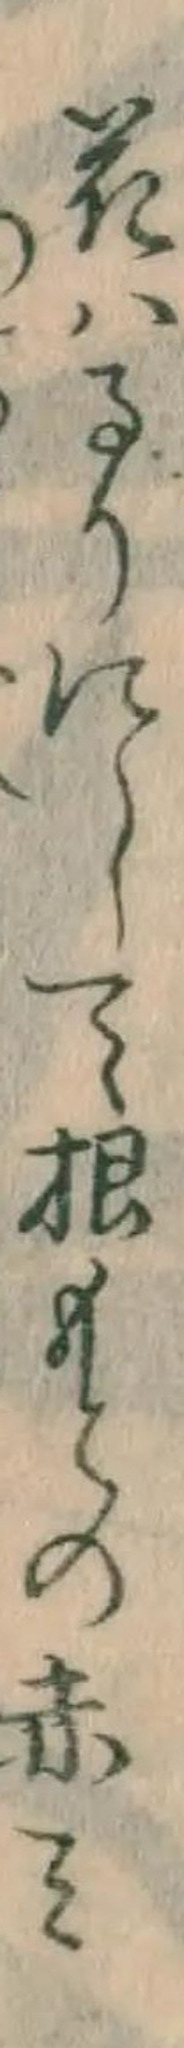花はるりにして根もとの赤み
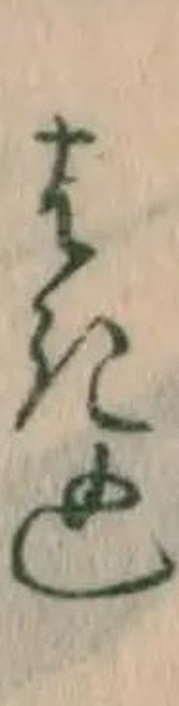はき込
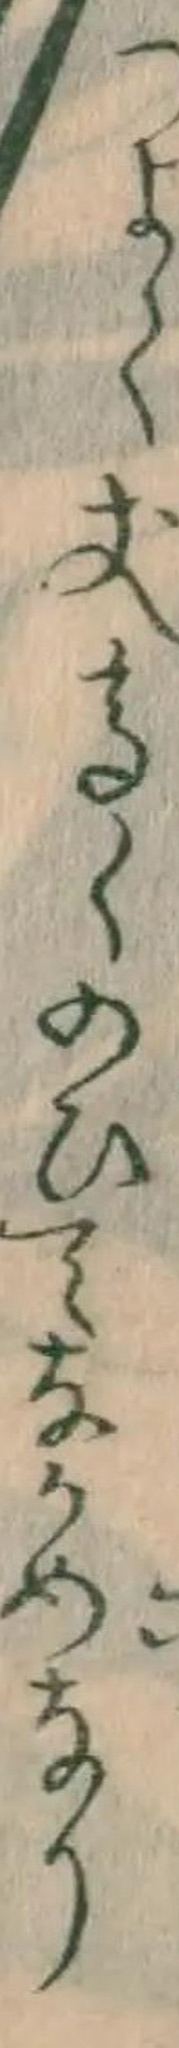つよく丈高くのひてなかめなり
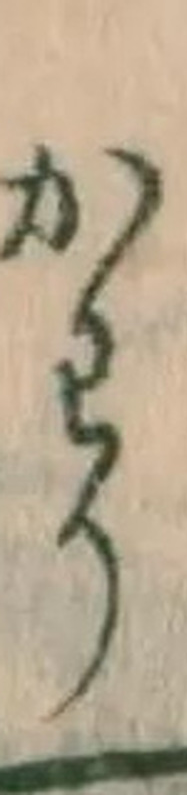かわり
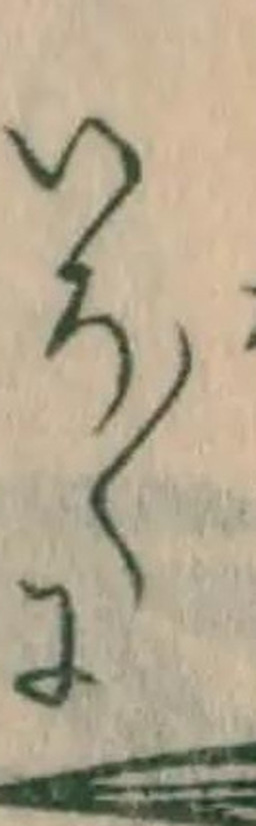いろ〳〵に

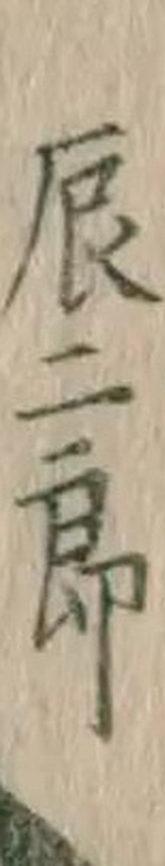辰二郎
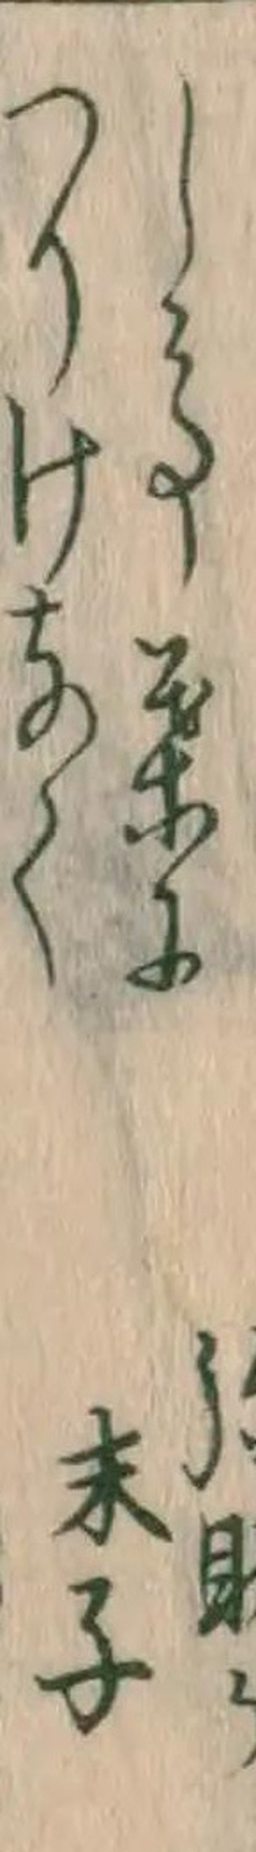つりけなく末子
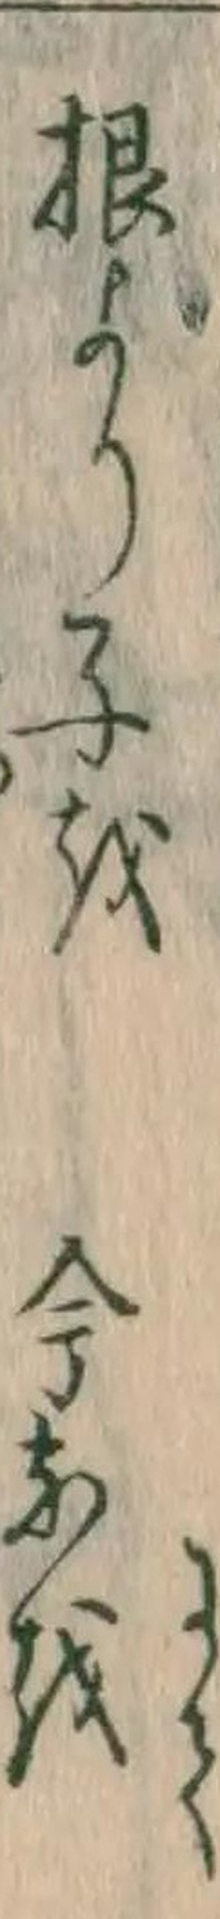根より子をにて
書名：草木奇品家雅見 3巻. [3]
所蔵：国立国会図書館 National Diet Library, JAPAN
